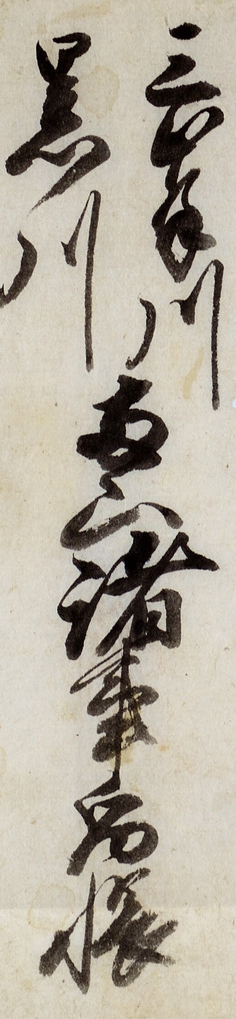黒川両山諸事留帳
